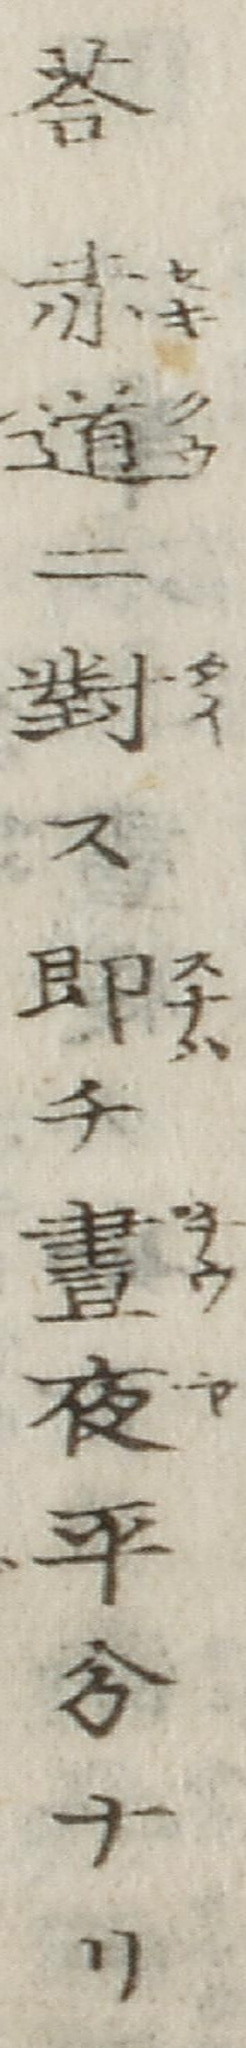答赤道ニ対ス即チ昼夜平分ナリ
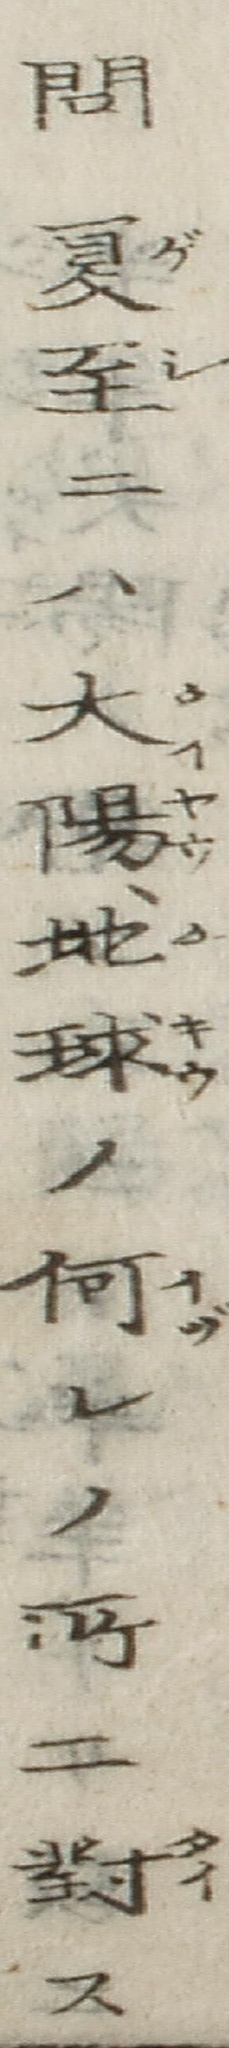問夏至ニハ大陽、地球ノ何レノ所ニ対ス
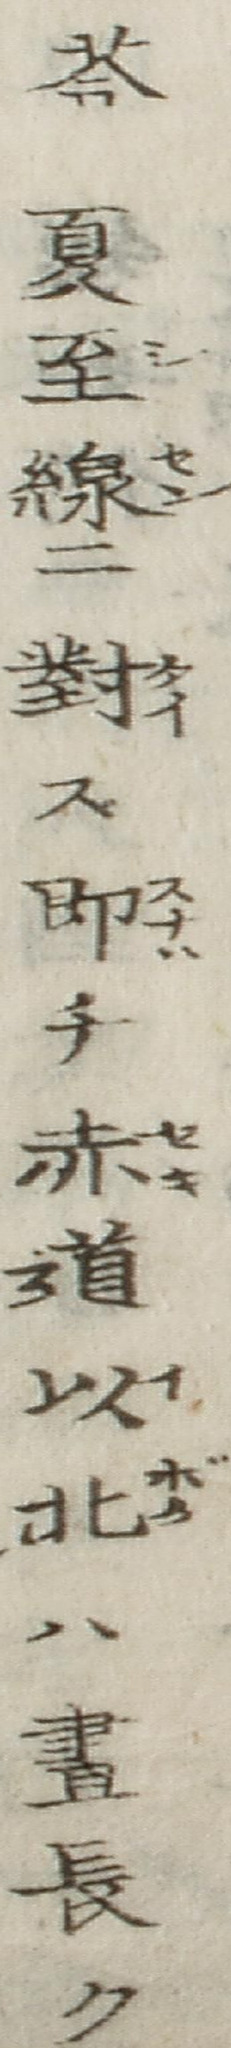答夏至線ニ対ス即チ赤道以北ハ昼長ク
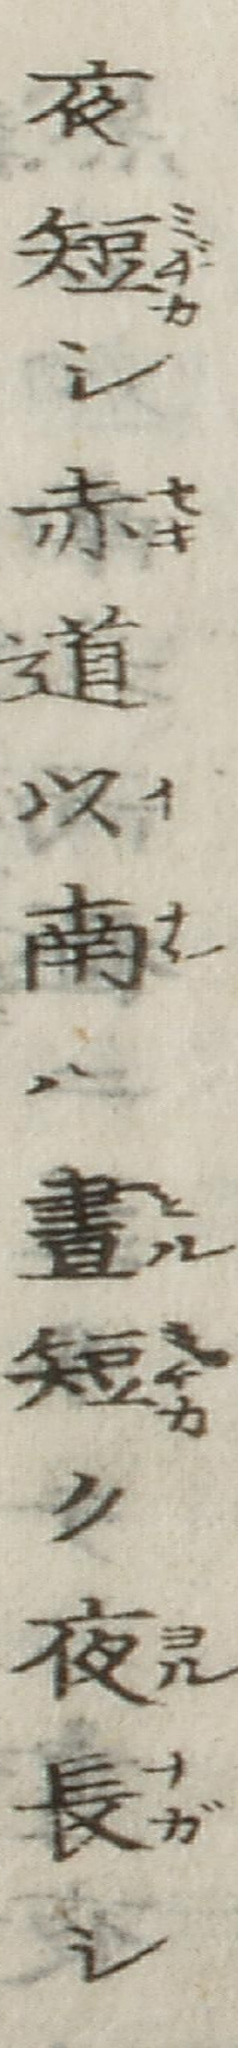夜短シ赤道以南ハ昼短ク夜長シ
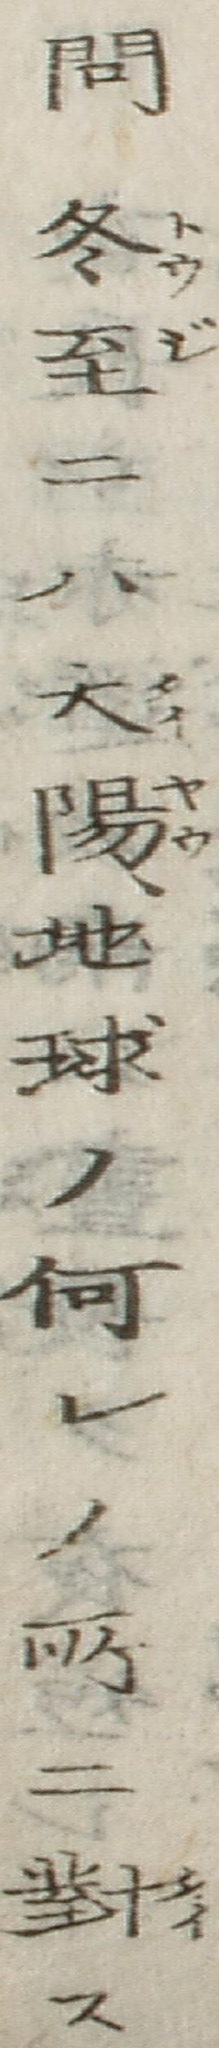問冬至ニハ大陽、地球ノ何レノ所ニ対ス

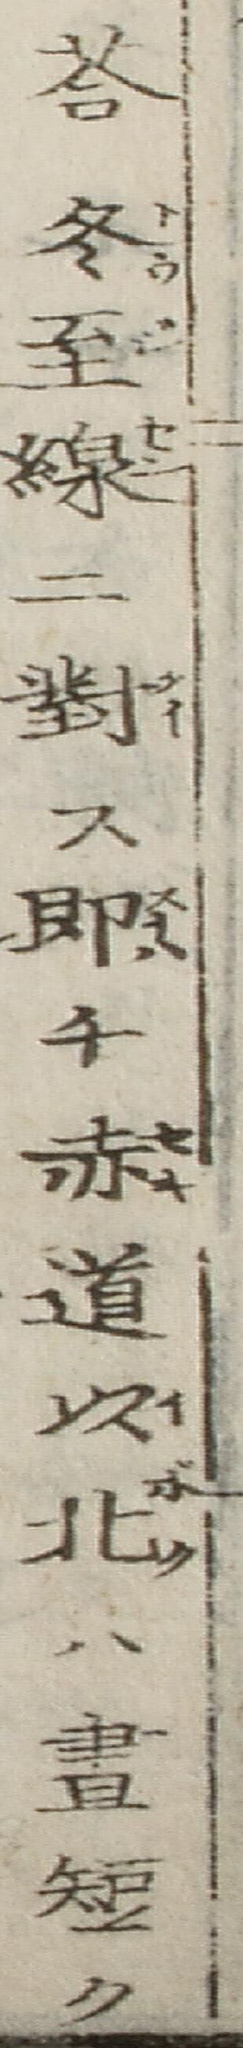答冬至線ニ対ス即チ赤道以北ハ昼短ク
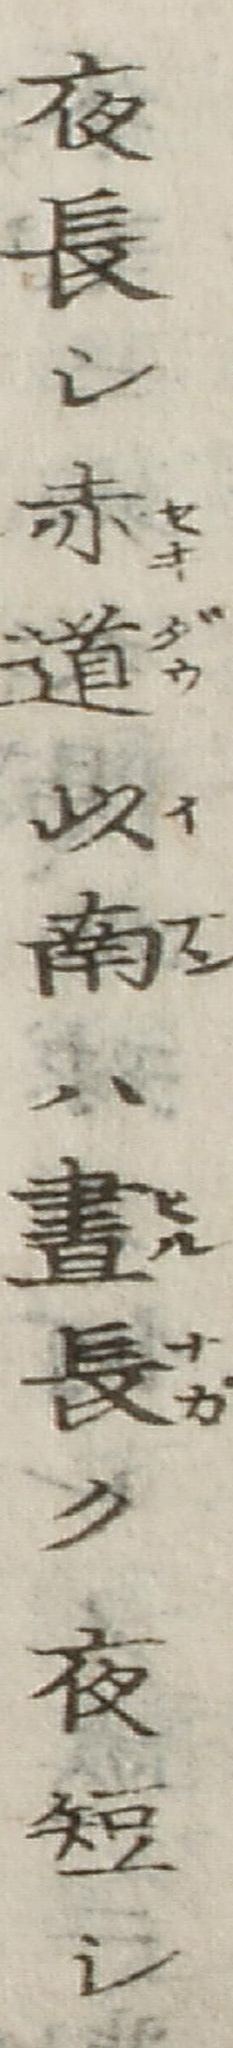夜長シ赤道以南ハ昼長ク夜短シ
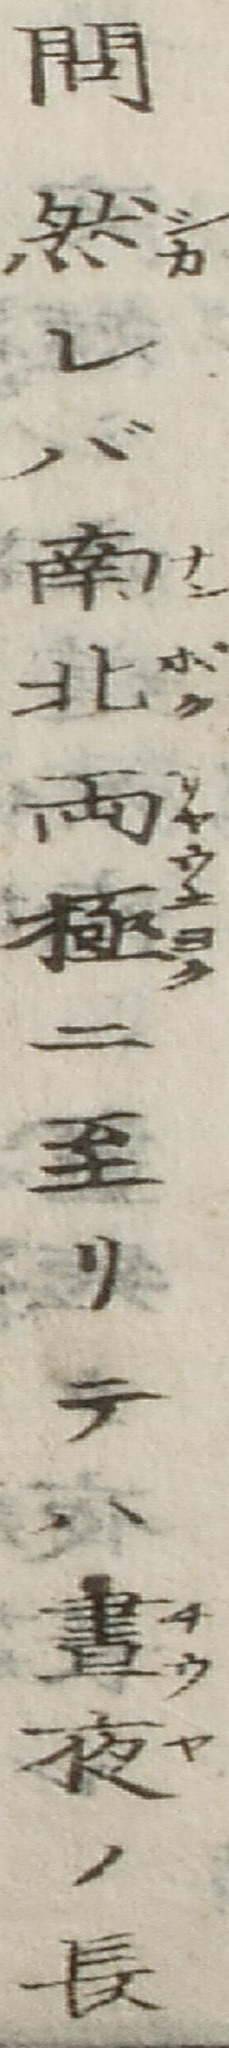問然レバ南北両極ニ至リテハ昼夜ノ長
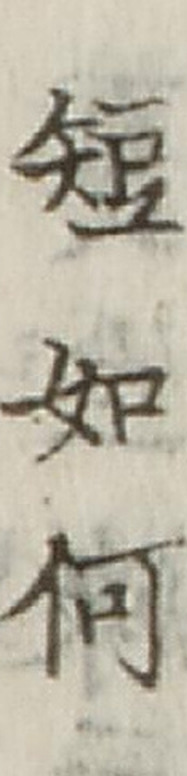短如何
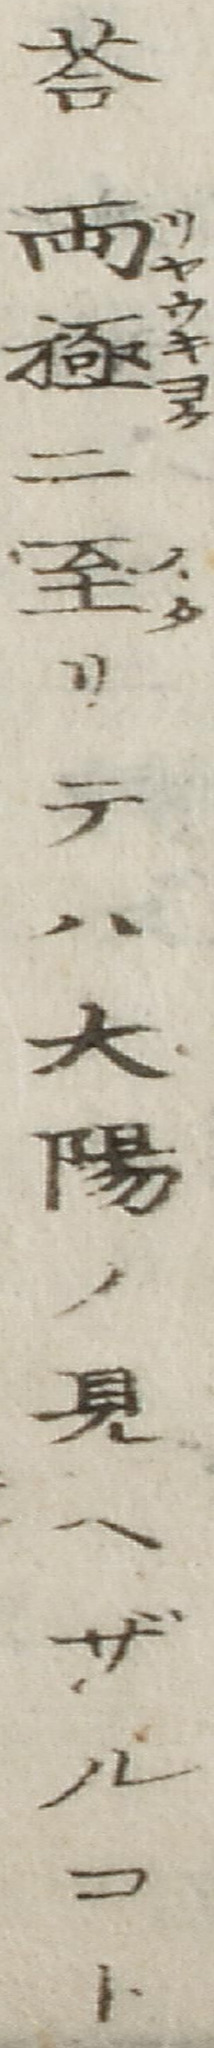答両極ニ至リテハ太陽ノ見ヘザルコト
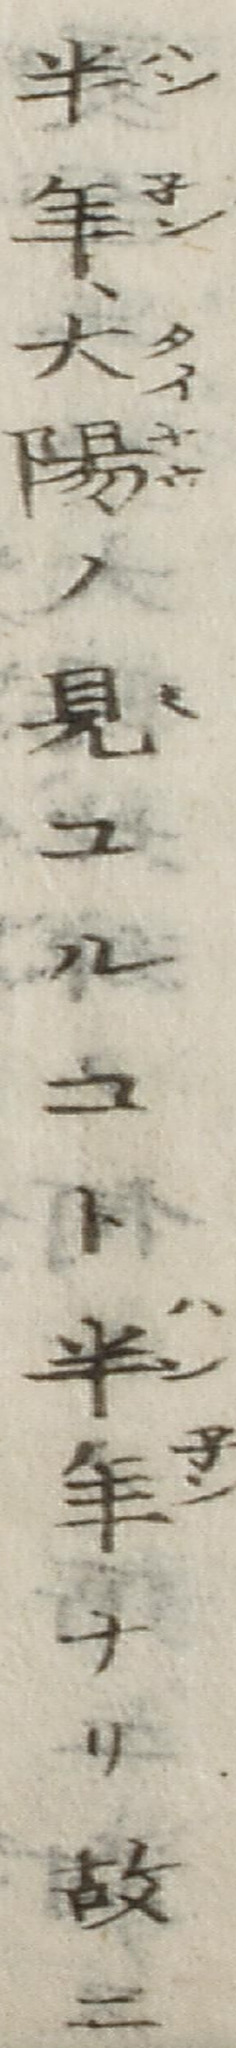半年、大陽ノ見ユルコト半年ナリ故ニ
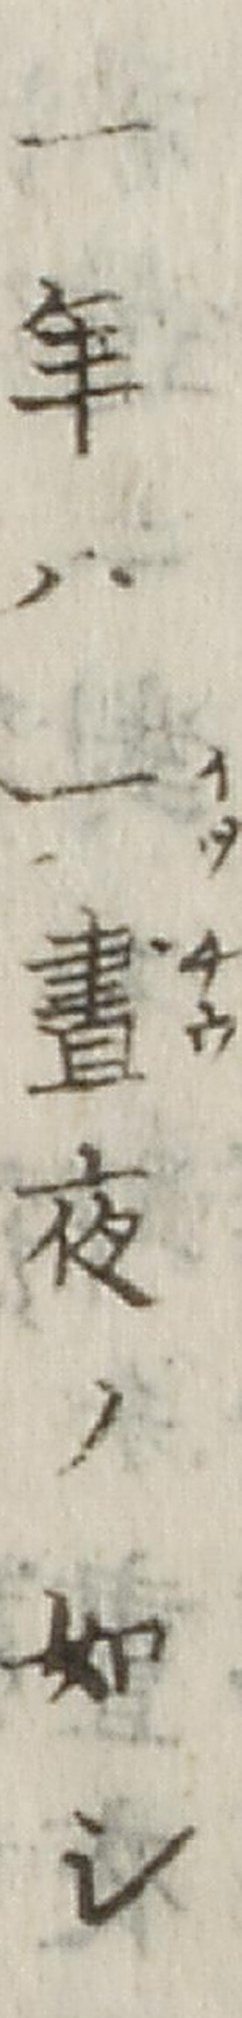一年ハ一昼夜ノ如シ
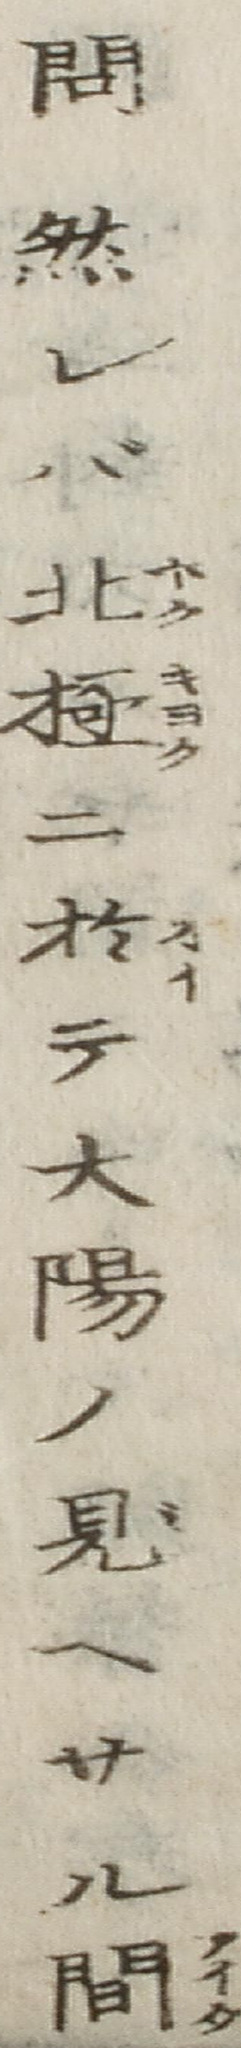問然レバ北極ニ於テ大陽ノ見ヘサル間
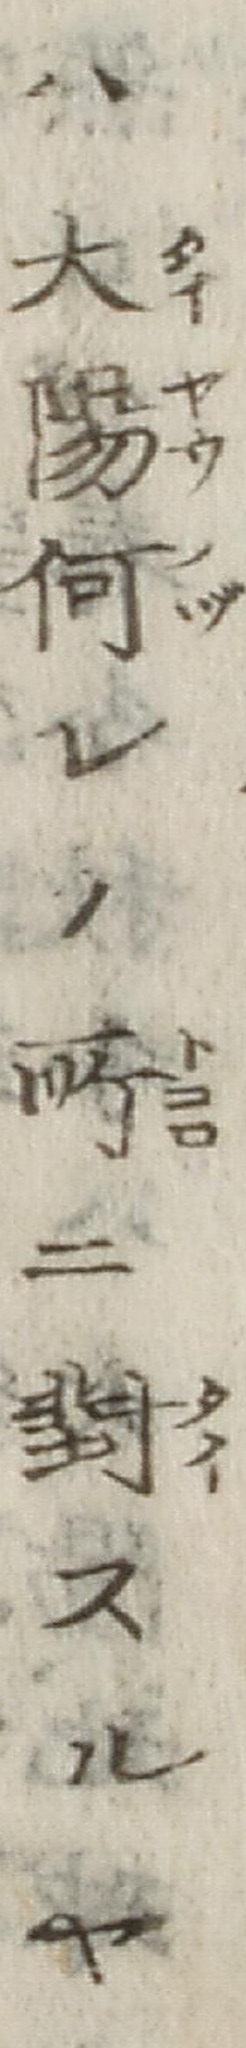ハ大陽何レノ所ニ対スルヤ
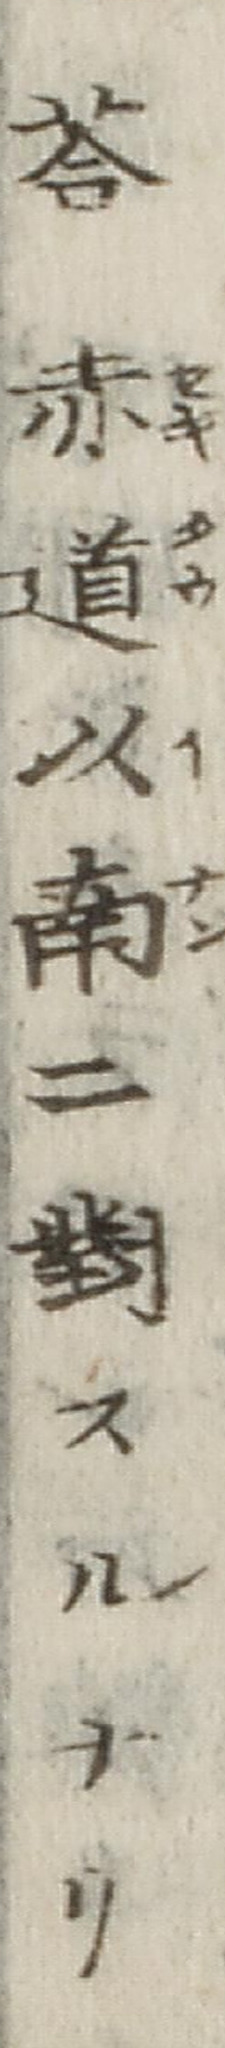答赤道以南ニ対スルナリ
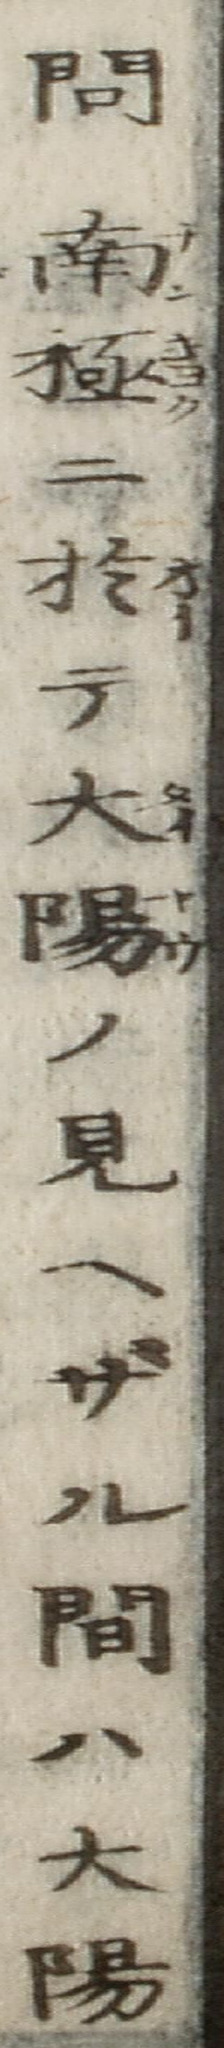問南極ニ於テ大陽ノ見ヘザル間ハ大陽
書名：地球儀問答　全
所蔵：東京大学地震研究所図書室 Earthquake Research Institute Library, The University of Tokyo, JAPAN
